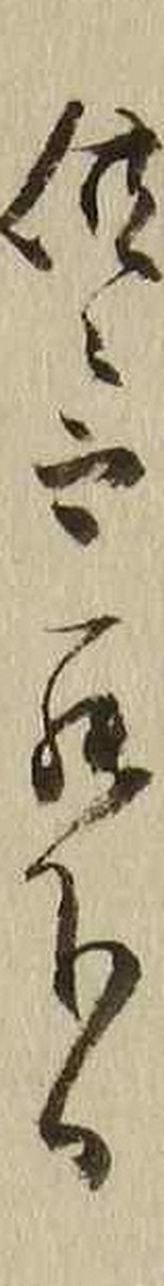供ニ而罷下候
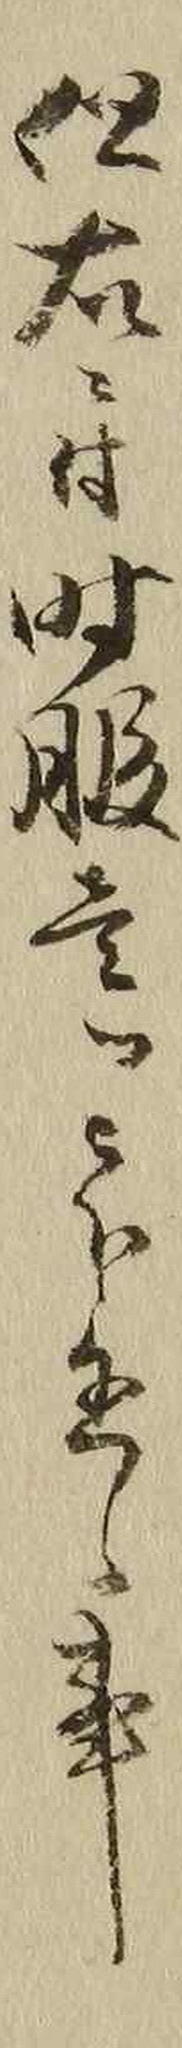但右ニ付時服壱ツ被下置候事
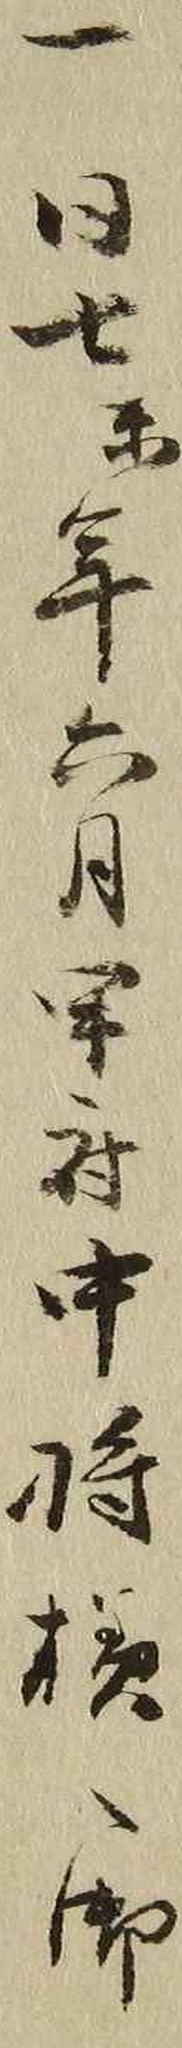一同七未年六月甲府中将様へ御
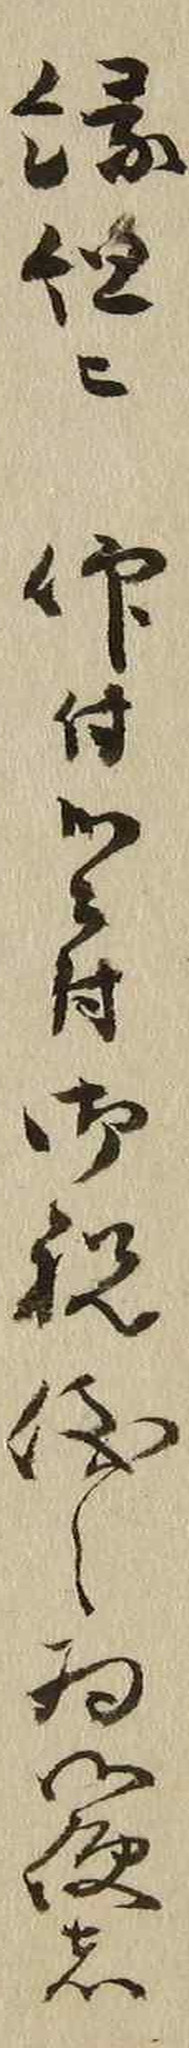縁組被仰付候ニ付御祝儀之爲御使者
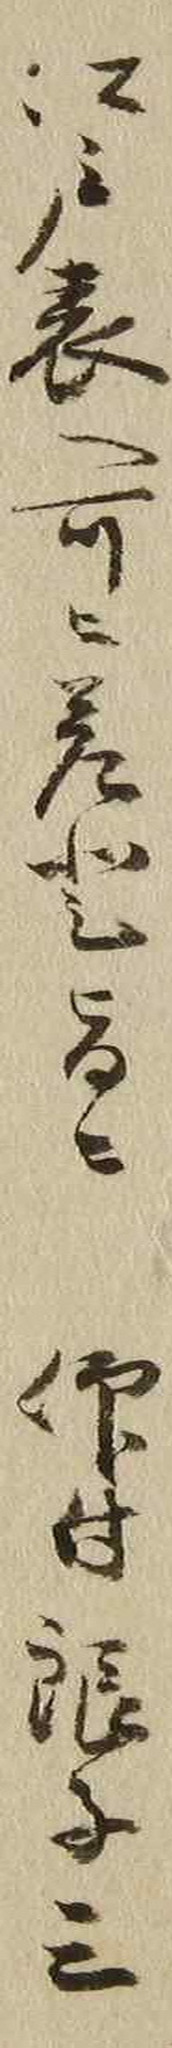江戸表へ可被差登旨被仰付銀子三
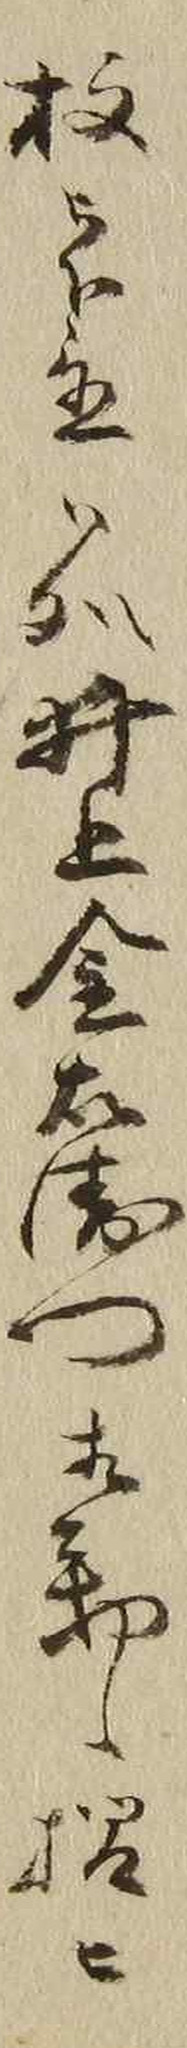枚被下置候処井上金右衛門相勤候様被
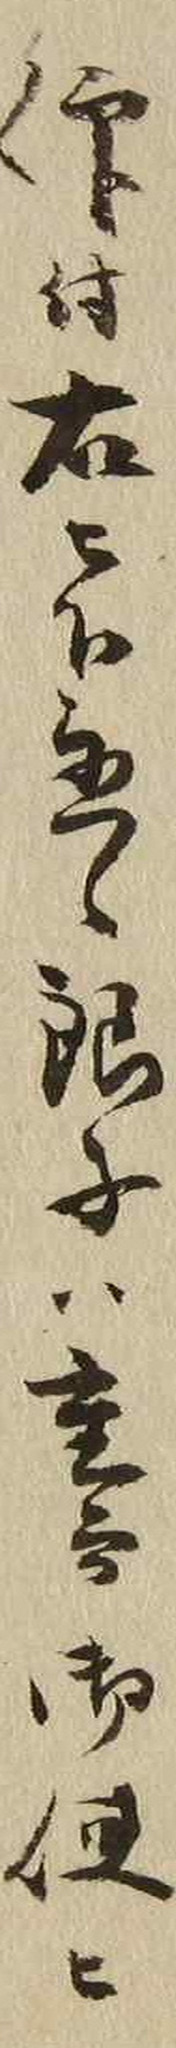仰付右被下置銀子ハ重而御使被
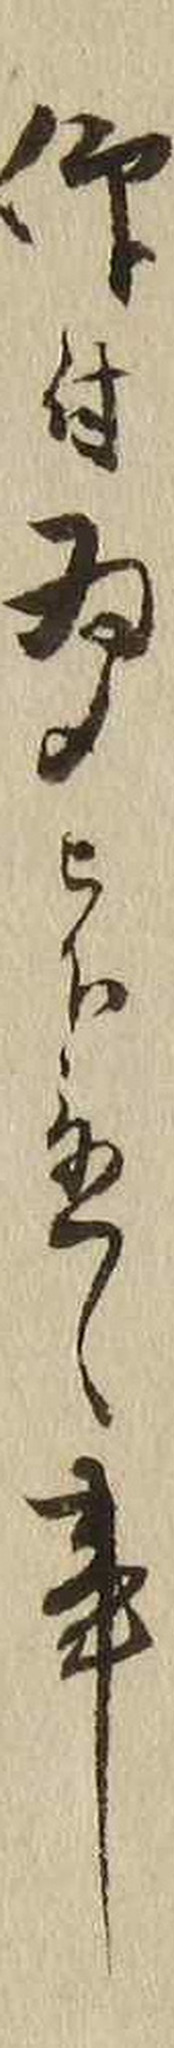仰付為〆被下置候事
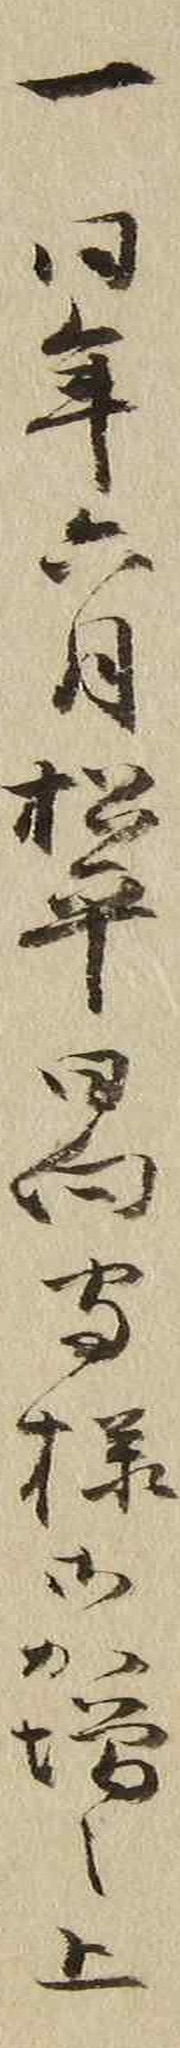一同年六月松平日向守様御加増之上
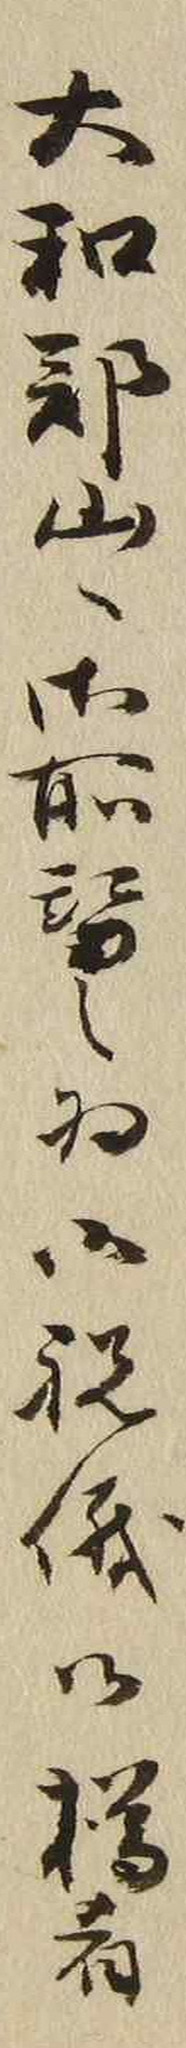大和郡山へ御所替之爲御祝儀御樽者
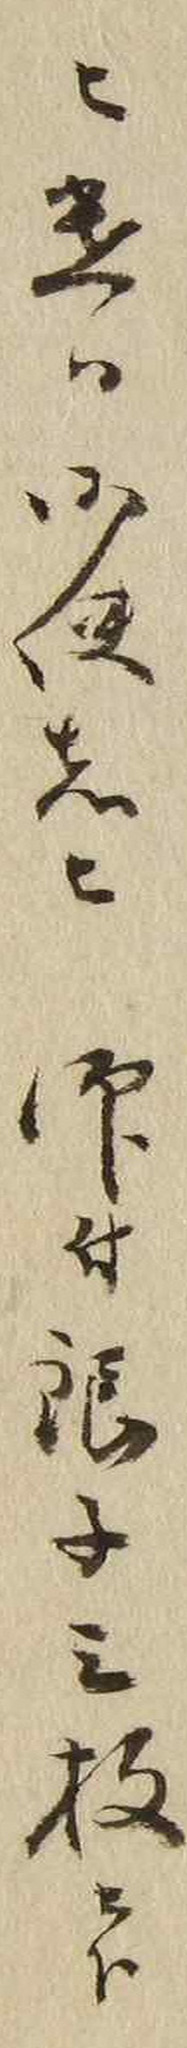被遣候御使者被仰付銀子三枚被下
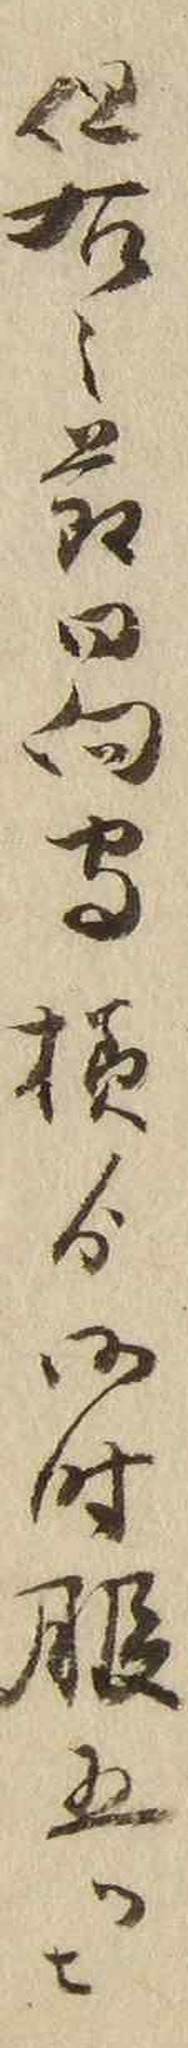但右之節日向守様ゟ御時服五ツ被

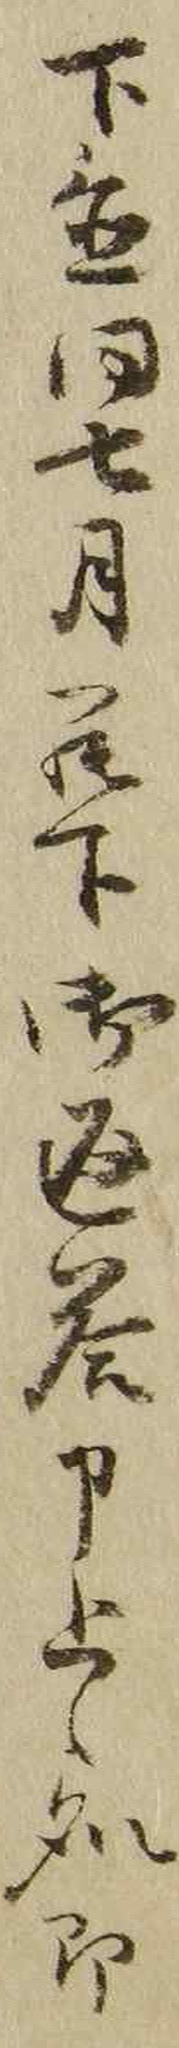下置同七月罷下御返答申上候処即
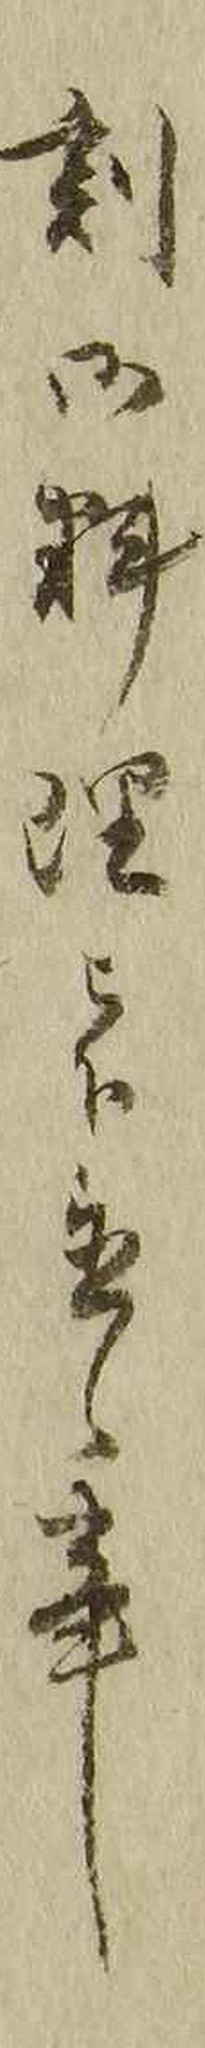刻御料理被下置候事
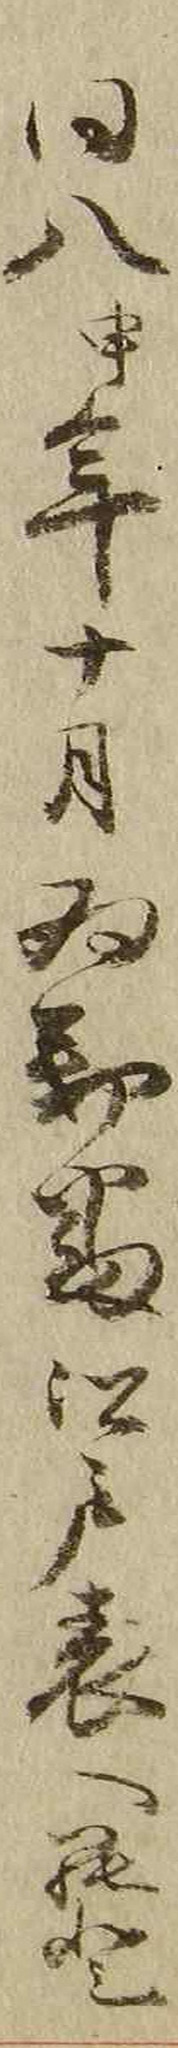一同八申年十月為勤番江戸表へ罷登
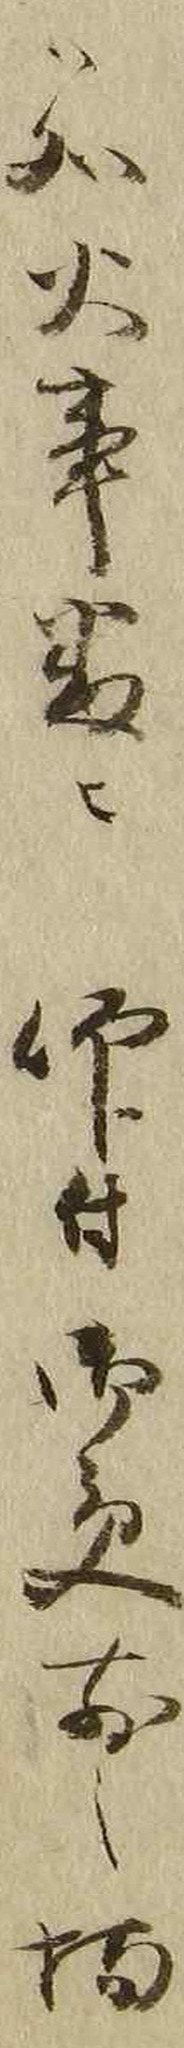候処火事番被仰付御受前之場
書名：諸士系譜　巻之232　け之部1
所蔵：会津若松市立会津図書館
